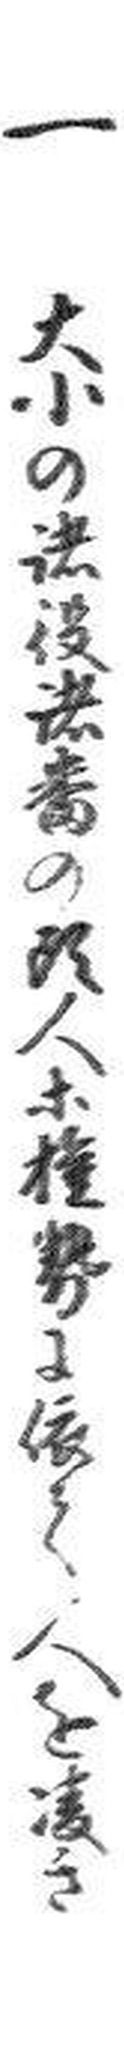一大小の諸役諸番の頭人等権勢に依て人を凌き
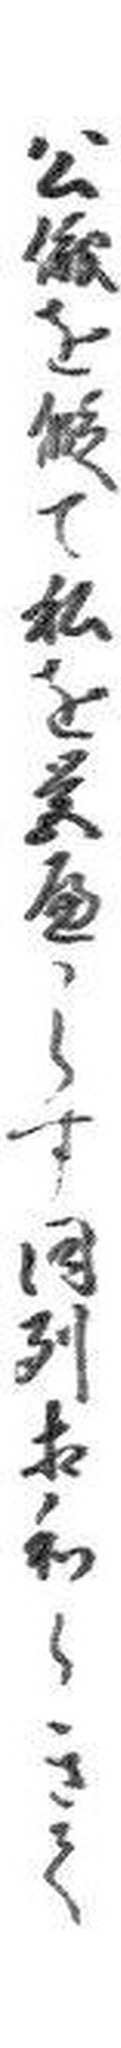公儀を假て私を営へからす同列相和らきて
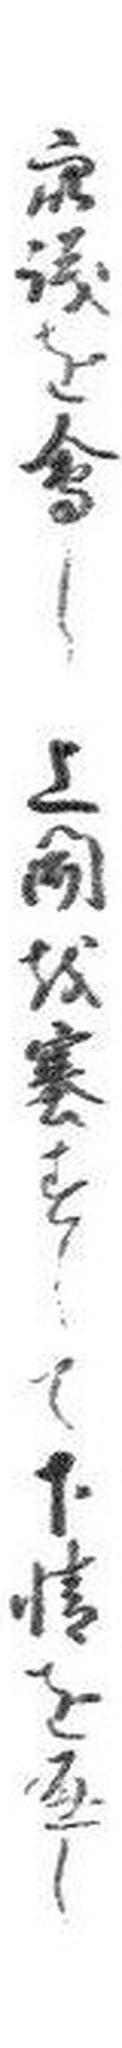衆議を会し上聞を塞すして下情を通し
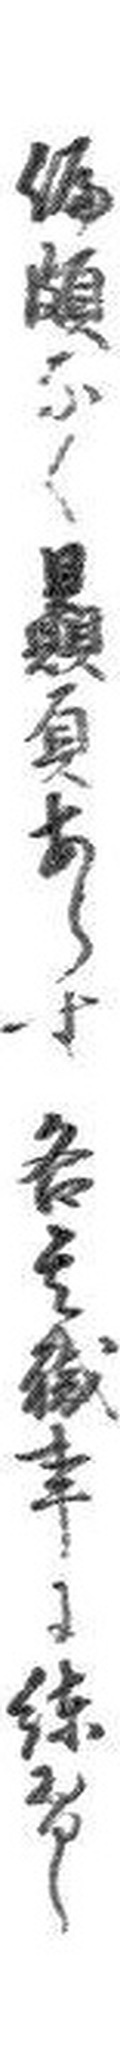偏頗なく贔屓あらす各其職事に練習し
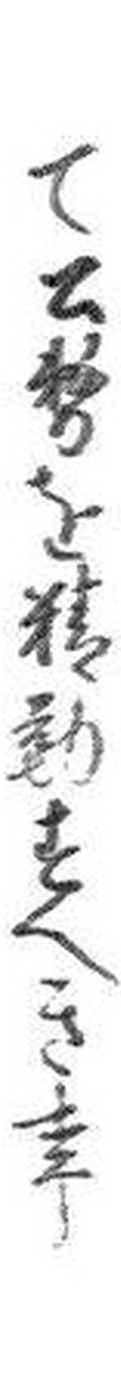て公務を精勤すへき事
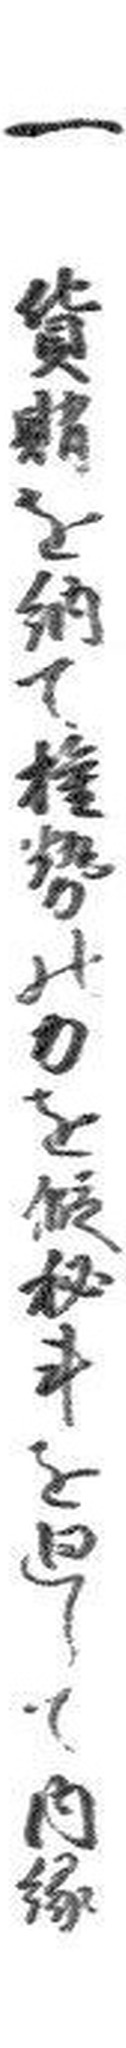一貨賄を納て権勢の力を假秘計を廻して内縁

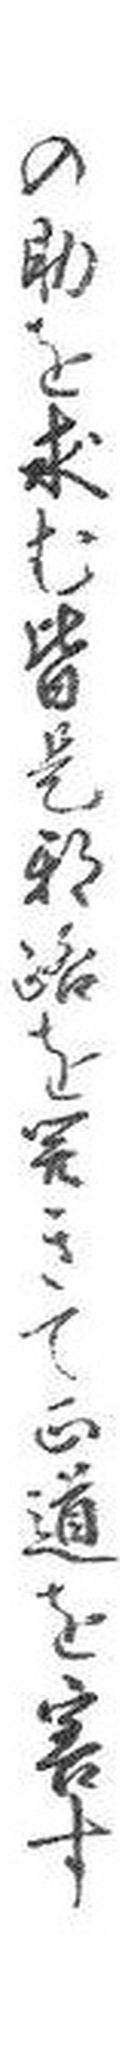の助を求む皆是邪路を開きて正道を害す
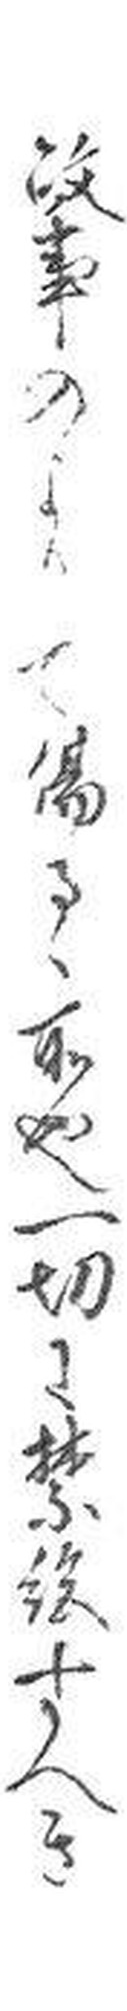政事のよりて傷るゝ所や一切に禁絶すへき
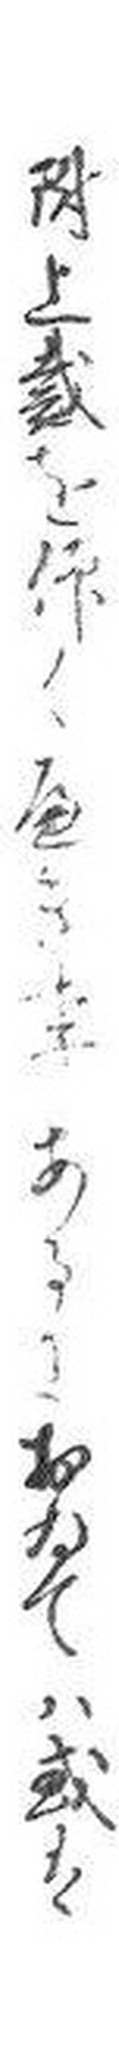附上裁を仰くへき事あるにおゐては或は
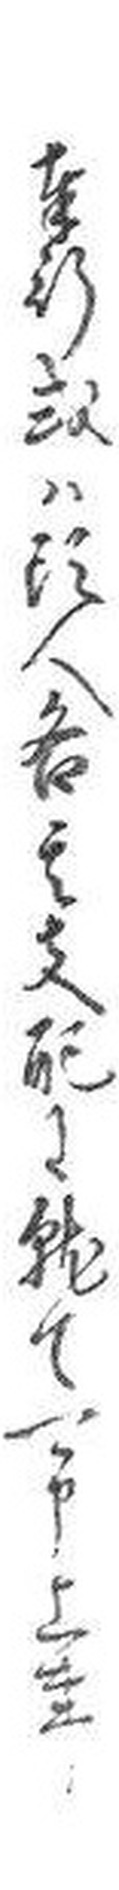奉行或は頭人各其支配に就て可申上事
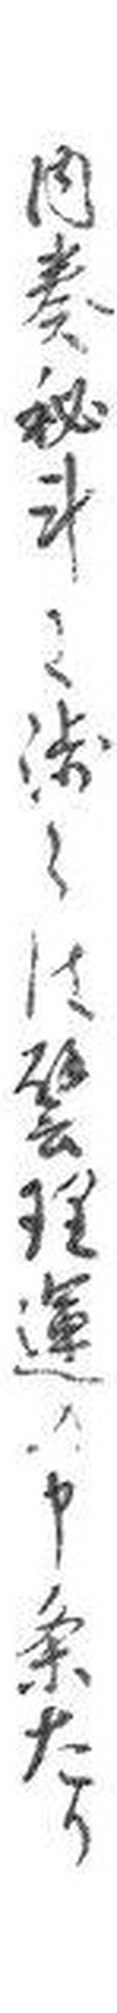内奏秘計に渉らす譬理運の申条たり
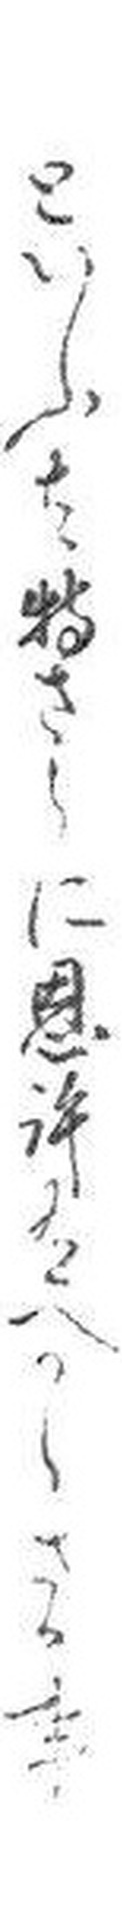といふ共特さらに恩許有へからさる事
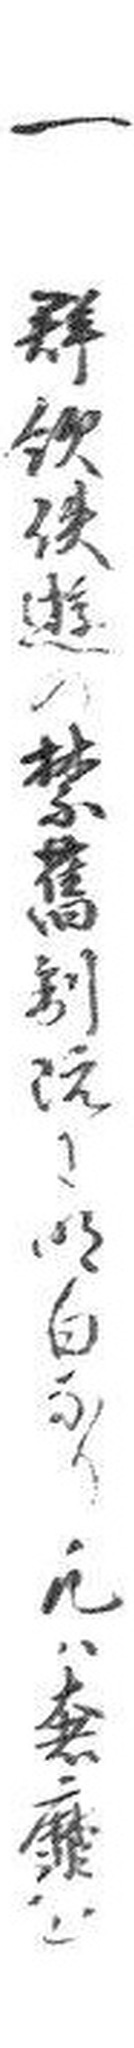群歓使遊の禁旧制阮に明白なり凡は奢靡を
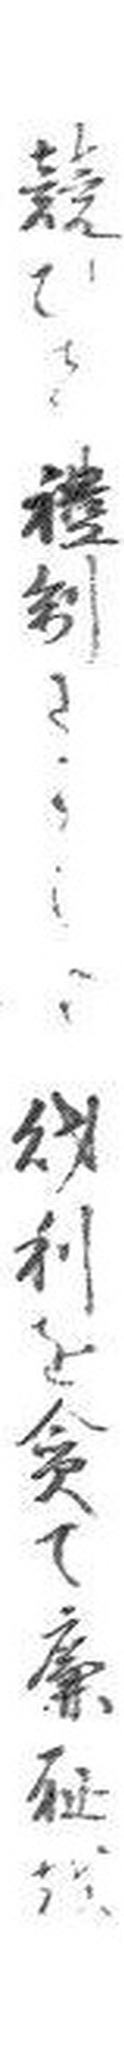競ひて礼制によらす財利を貪て廉恥を
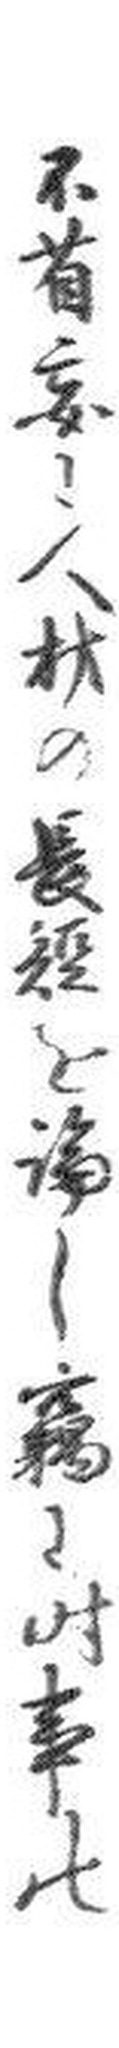不省妄に人材の長短を論し窃に時事の
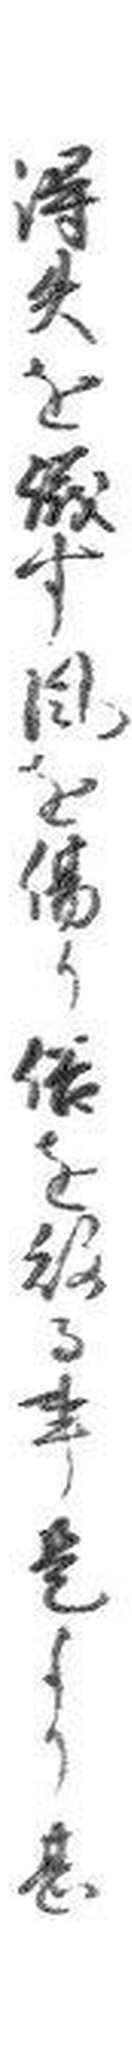得失を議す風を傷り俗を敗る事是より甚
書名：家譜 二十五 吉品公 従宝永六年到同七年
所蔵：福井県文書館 Fukui Prefectural Archives
